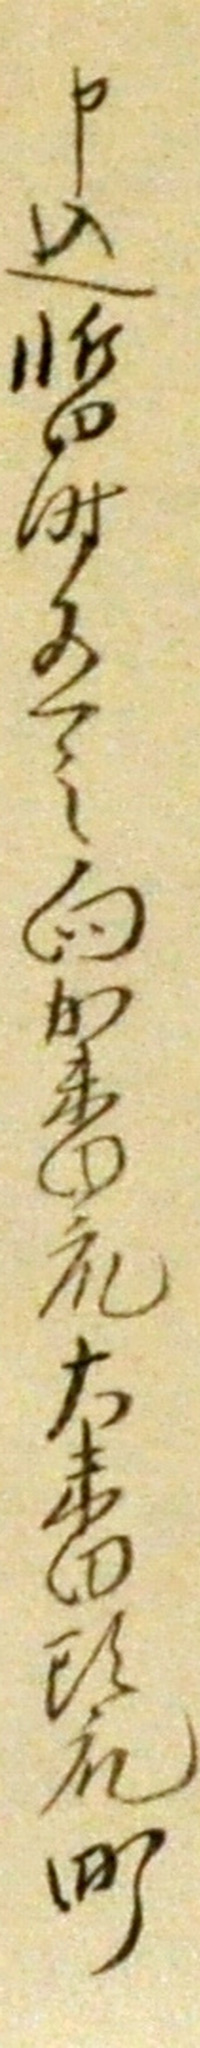申込暫時有之向加番衆大番頭衆町
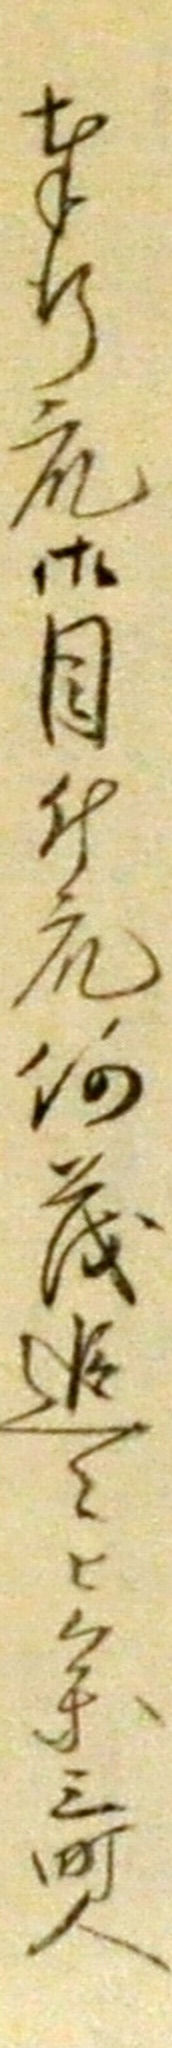奉行衆御目付衆何も追々被参三町人
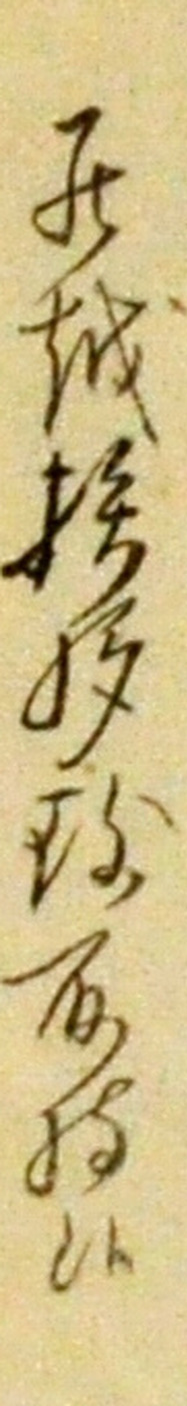罷越挨拶致取持候
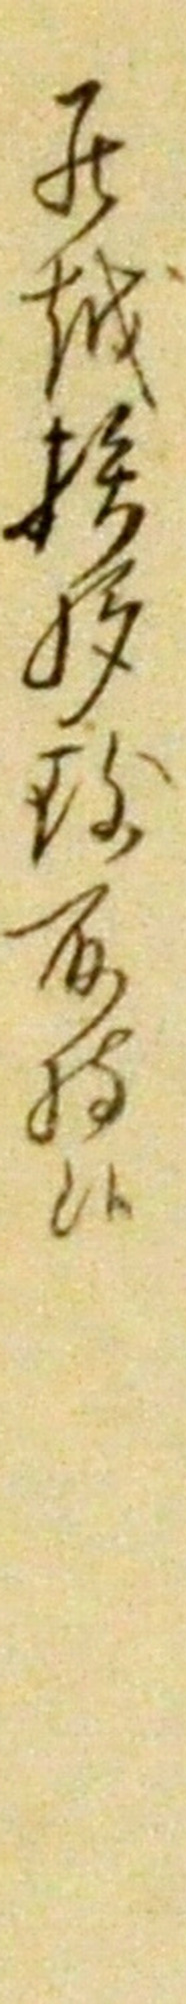罷越挨拶致取持候
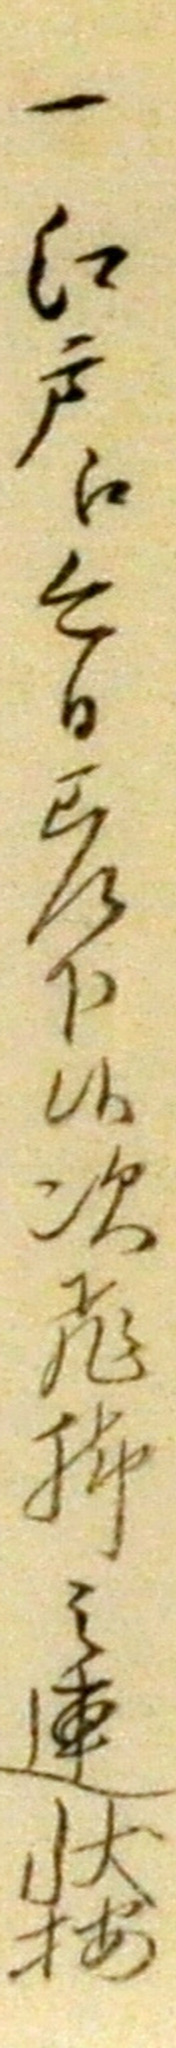一江戸え今日差下候次飛脚之連状按
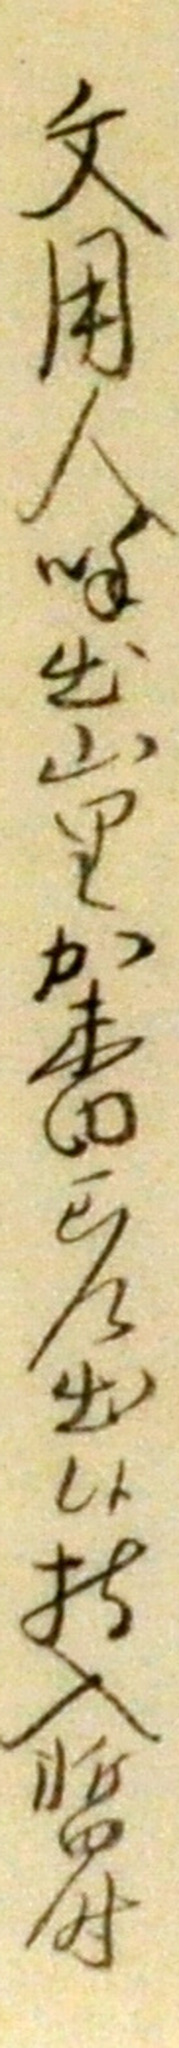文用人呼出山里加番差出候持入暫時
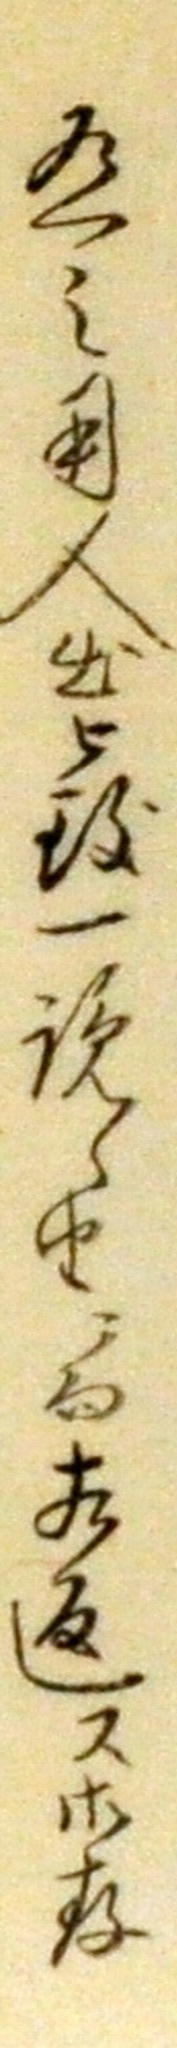有之用人出被致一覧之由に而相返ス御数
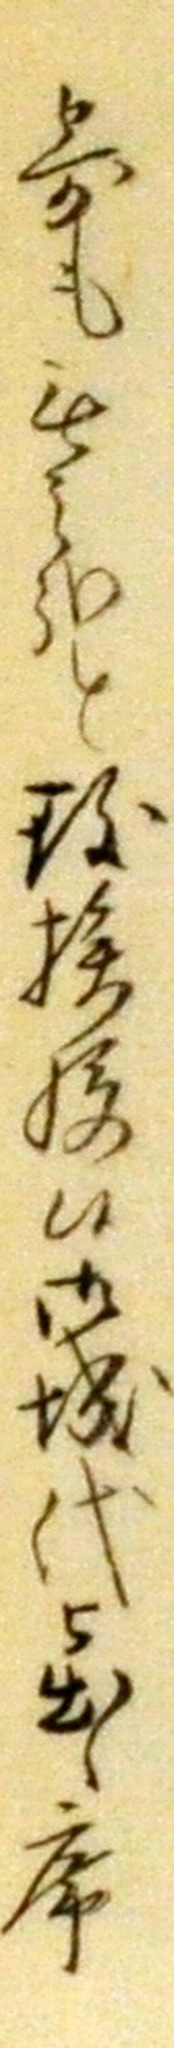寄も無之哉と致挨拶候御城代被出候席
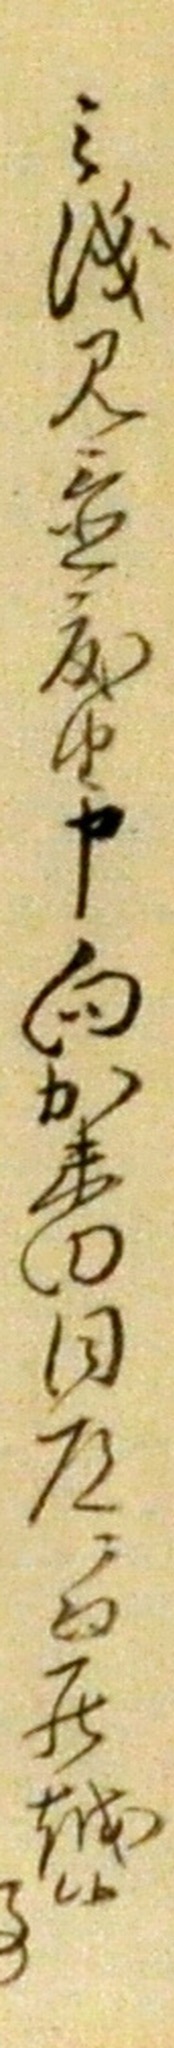之儀見置度由申向加番同道に而罷越候事
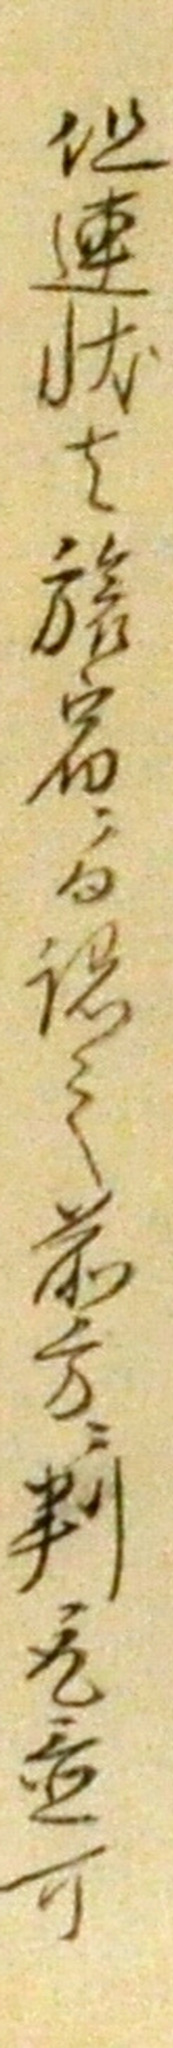但連状は旅宿に而認之前方に判取置可
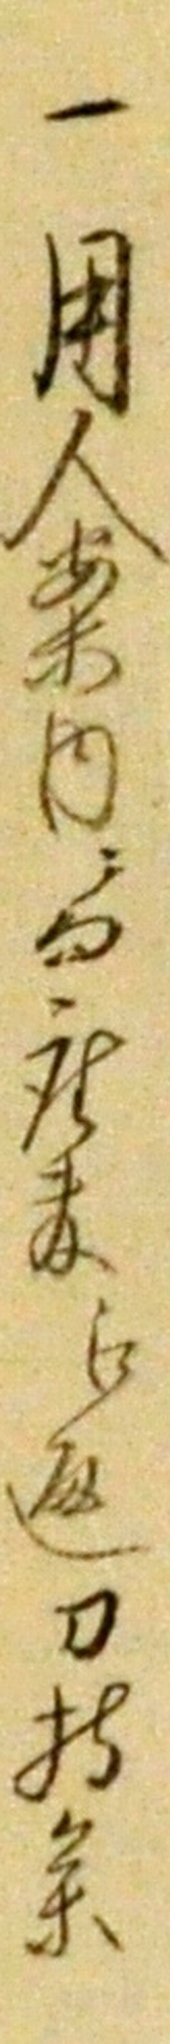一用人案内に而座敷え通刀持参
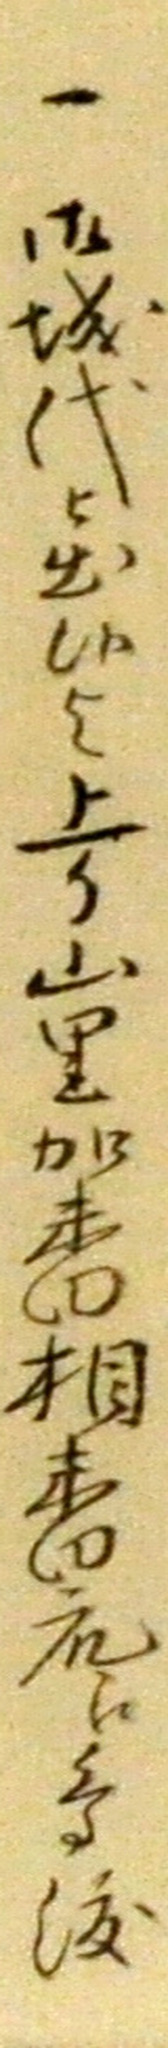一御城代被出候は上り山里加番相番衆え鳥渡
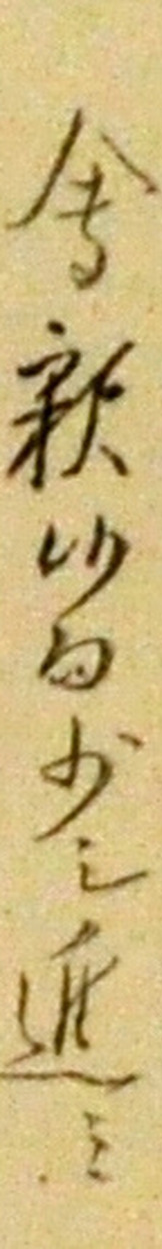会釈候而少シ進ミ
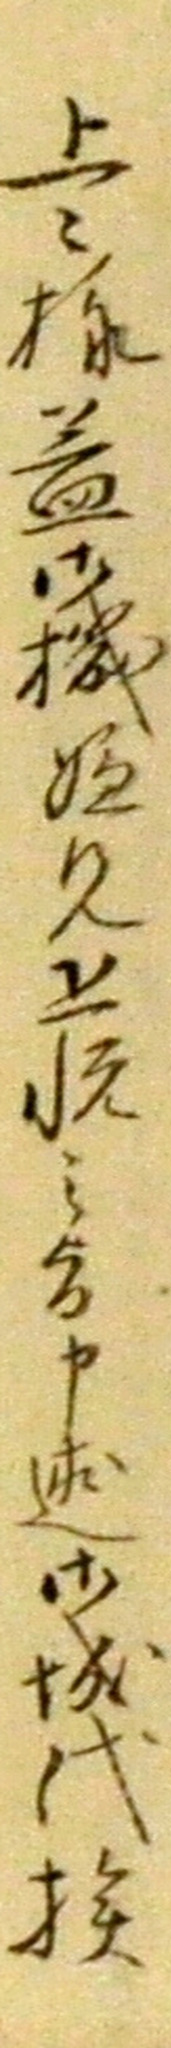上々様益御機嫌見恐悦之旨申述御城代挨
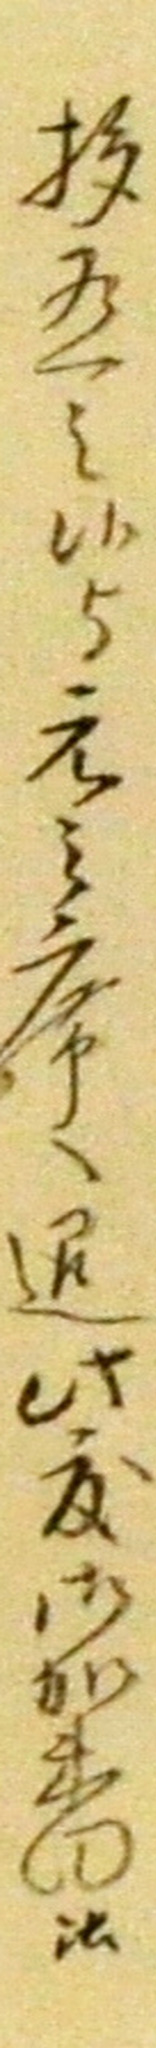拶有之候は元之席へ退此度御加番被
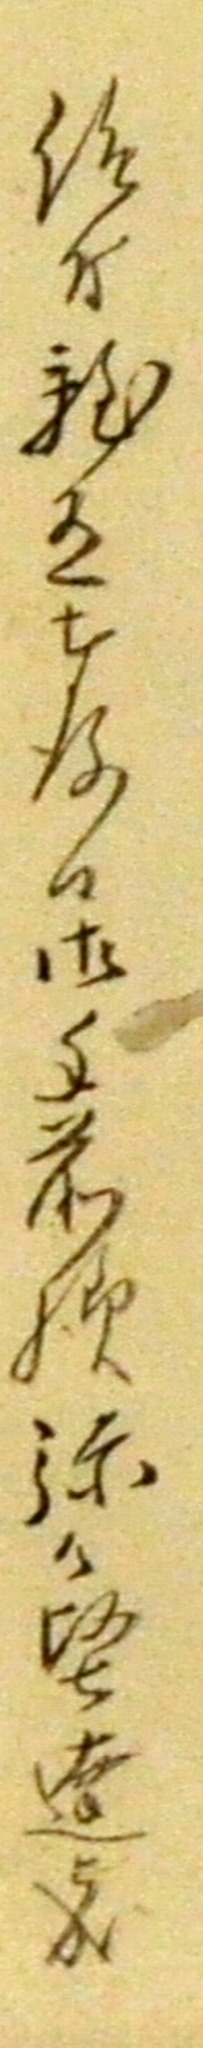仰付難有奉存候御手前様弥々堅達被成
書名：大阪加番関係諸書留〔一括〕
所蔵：伊那市立高遠町図書館・合同会社AMANE
